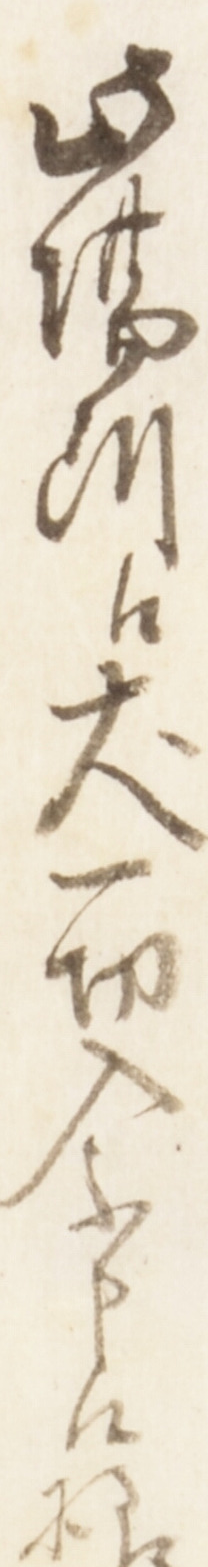此場所え犬一切入不申候様ニ
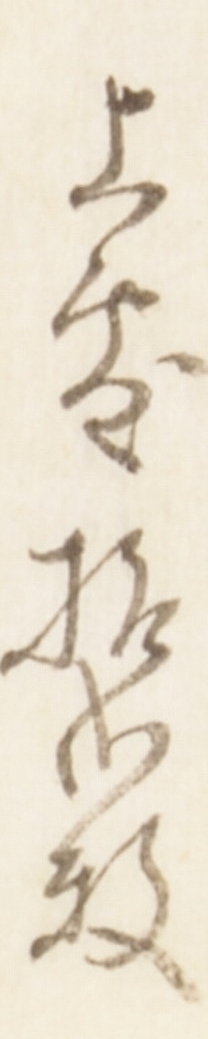上敷拾弐枚
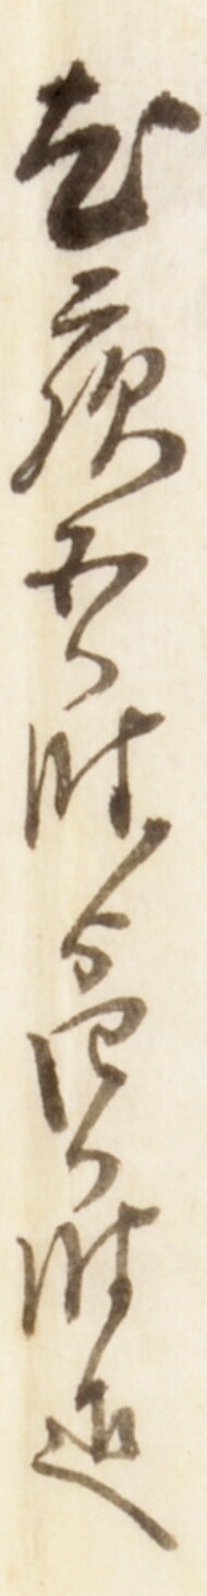尤夜五ッ時ゟ四ッ時迄
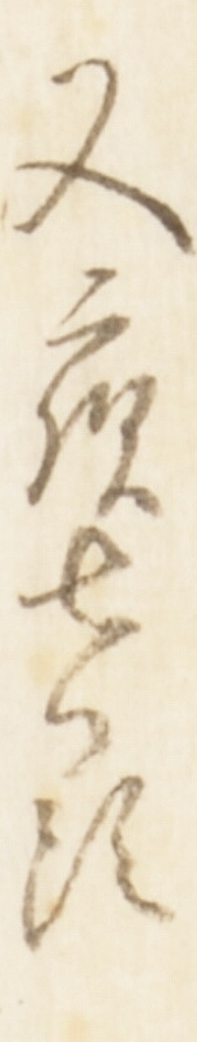又夜七ッ頃
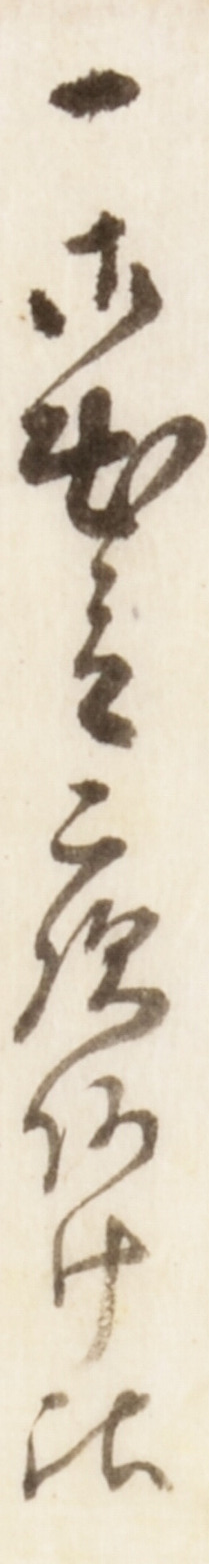一御出立夜あけ頃
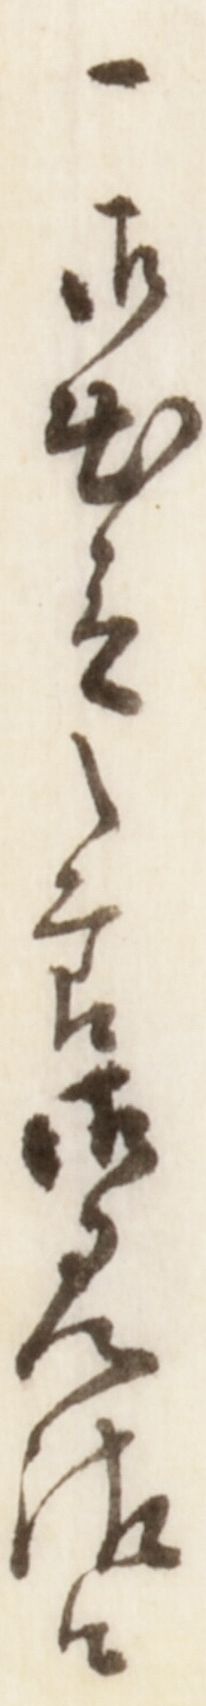一御出立之節御見請候
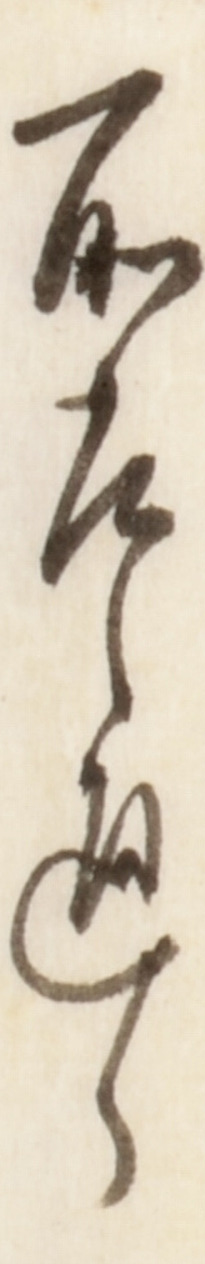所左之通り
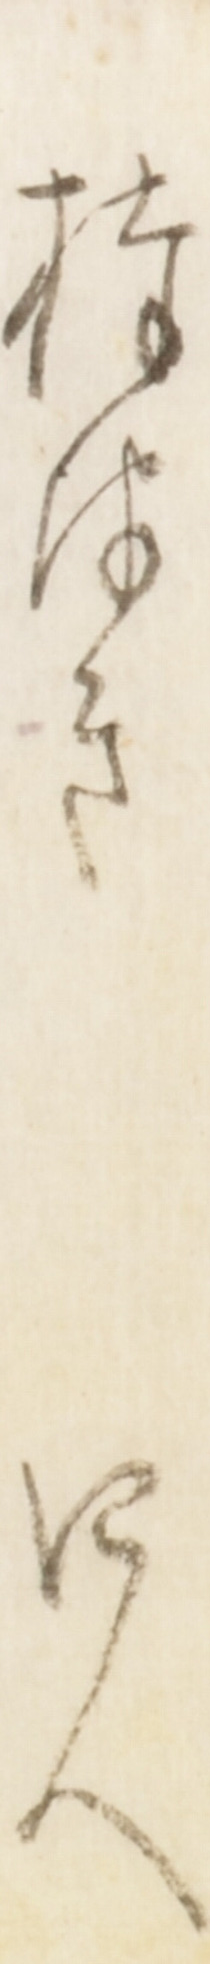持つき四人
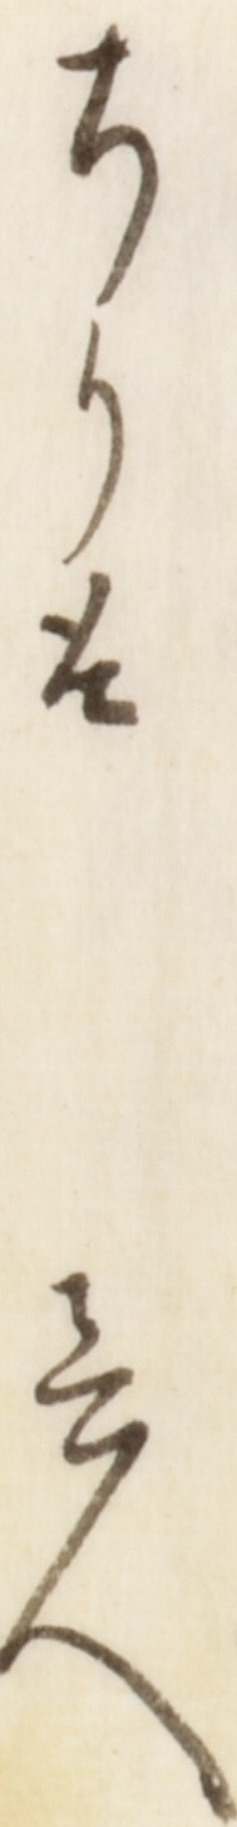ちり取壱人
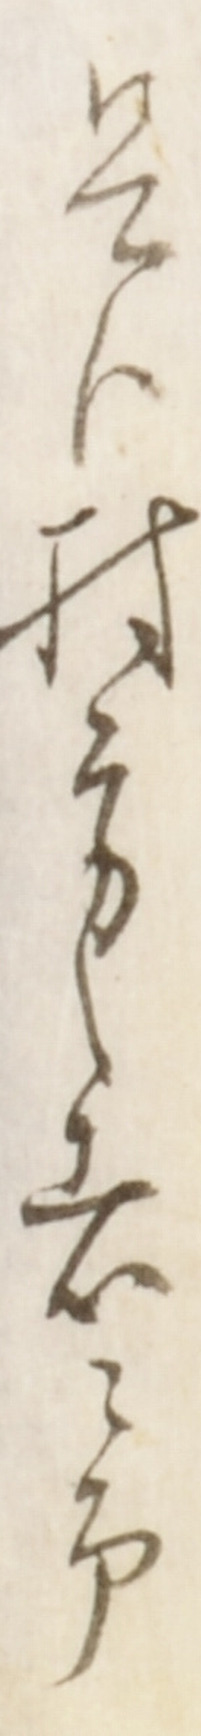是ハ村方之者ニ而

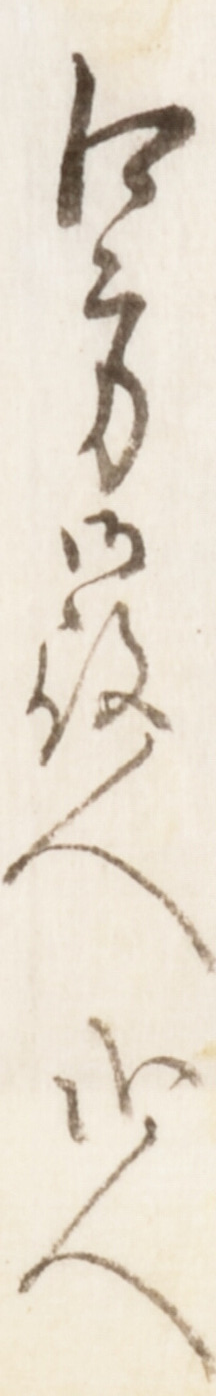郷方御役人弐人
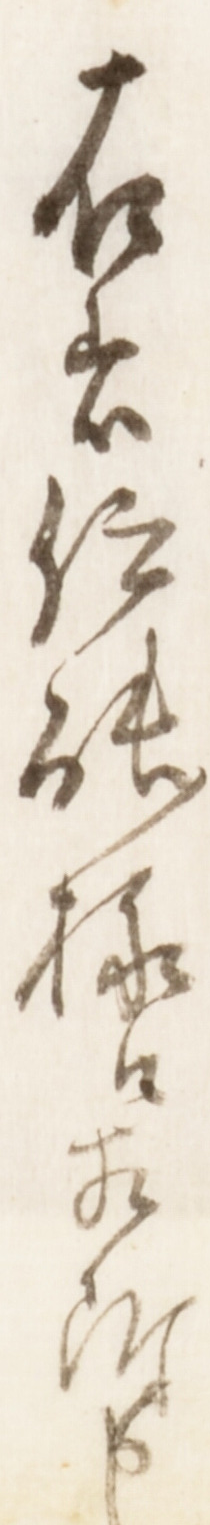右は伊能様え相附申候
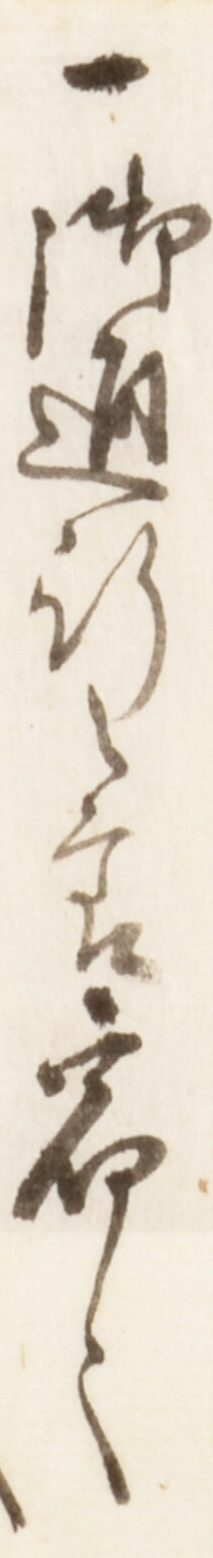一御通行之節宿ゝ
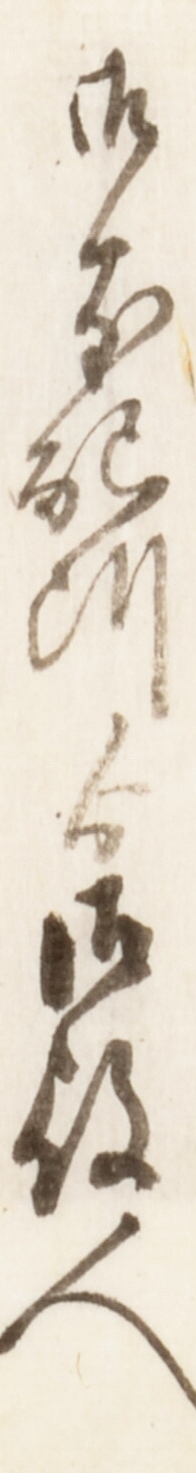御支配所ゟ御役人
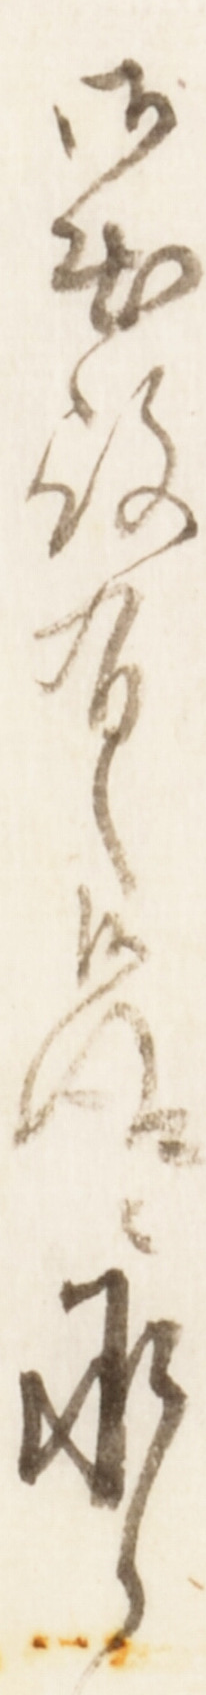御出役有之候様ニ承り
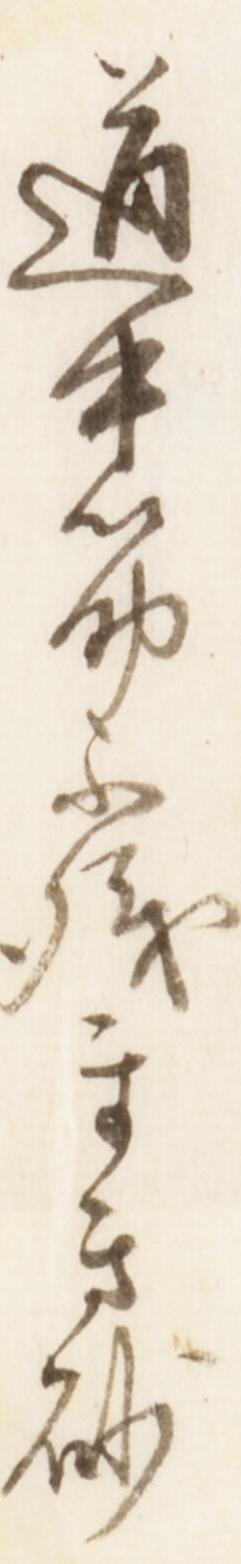道中筋不残まき砂
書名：（諸事控）
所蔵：伊那市立高遠町図書館・合同会社AMANE
